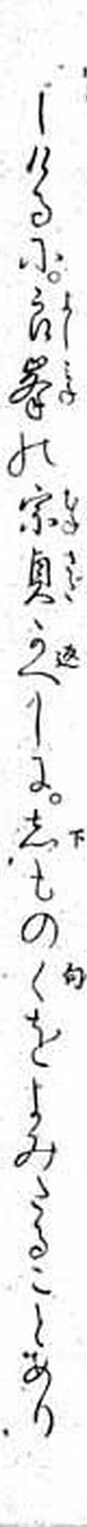しけるに。良峯の宗貞かへしに。しものくをよみたることあり

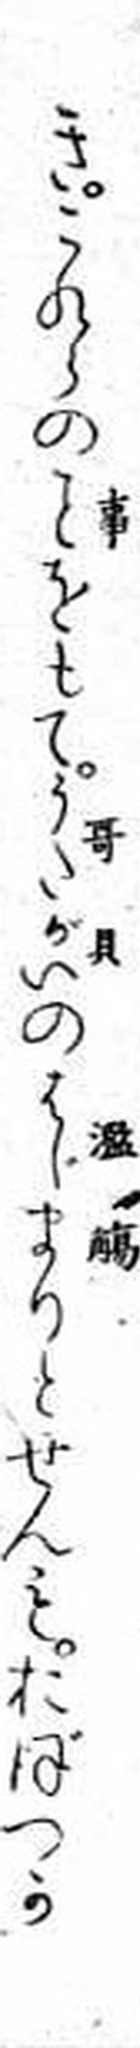き。これらのことをもて。うたがいのはじまりとせんこと。おぼつか
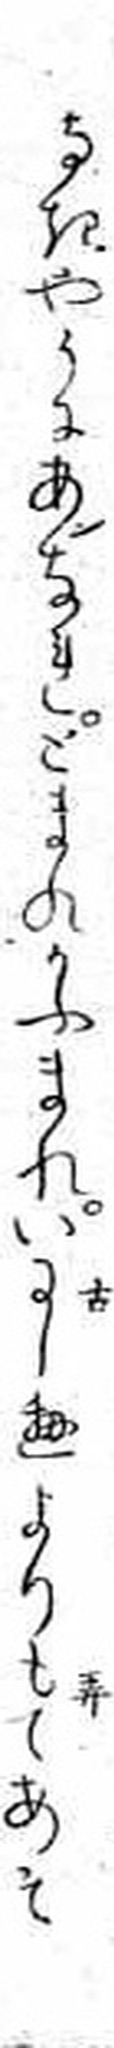なきやうにあ。とまれかふまれ。いにしへよりもてあそ
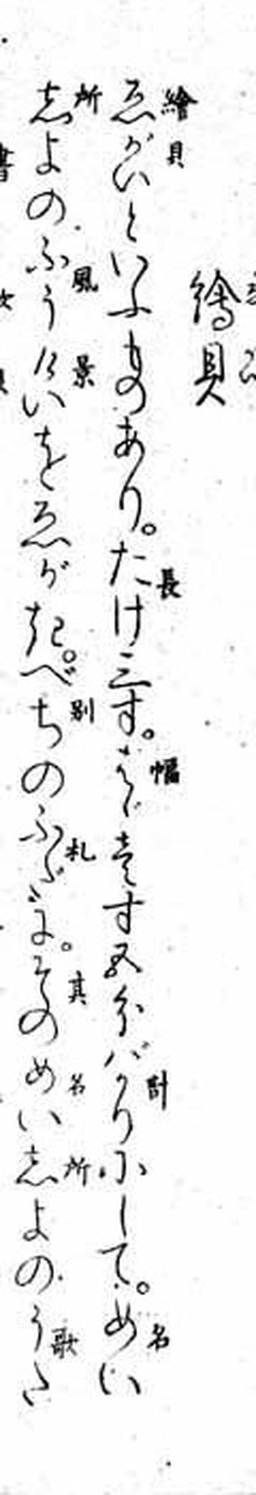ゑがいといふものあり。たけ三寸。はゞ壱寸五分ばかりにして。めい
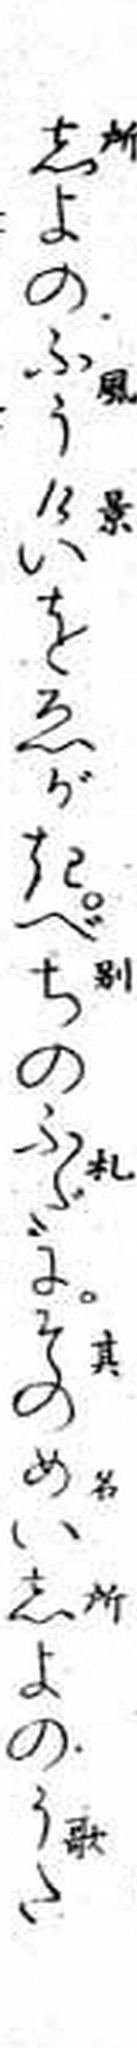しよのふうけいをゑがき。べちのふだに。そのめいしよのうた
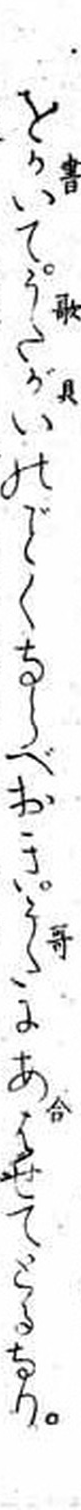をかいて。うたがいのごとくならべおき。うたにあはせてとるなり。
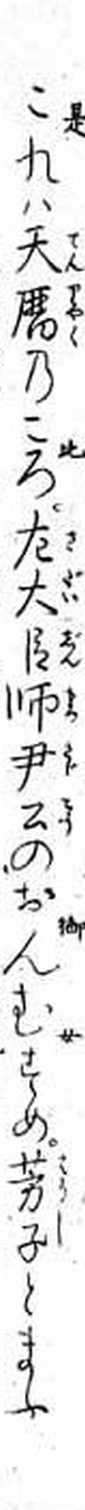これは天暦のころ。左大臣師尹公のおんむすめ。芳子とまふ
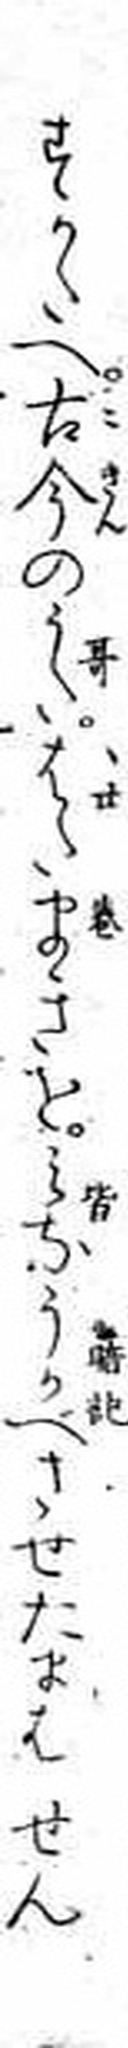すかたへ。古今のうたはたまきを。みなうかべさせたまはせん
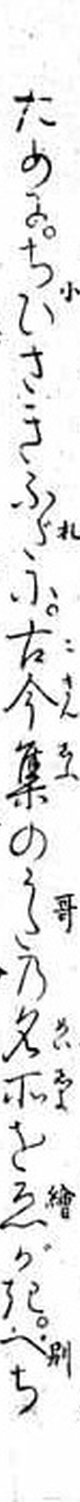ために。ちひさきふだに。古今集のうたの名所をゑがき。べち
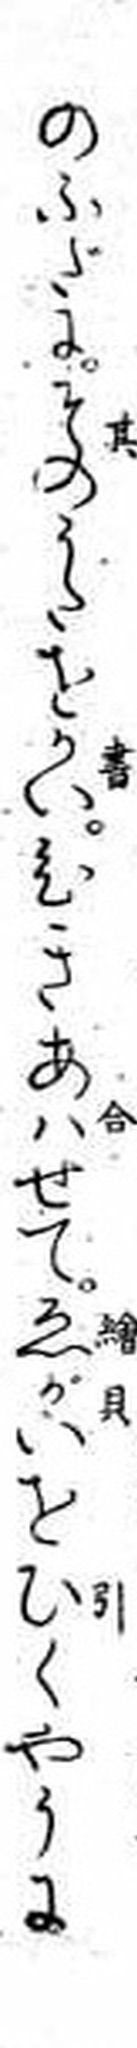のふだに。そのうたをかい。ひきあはせて。ゑがいをひくやうに
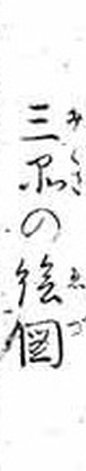三草の絵図

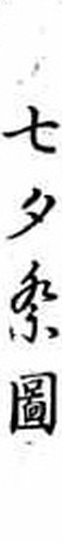七夕祭図
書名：女学範
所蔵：東京学芸大学教育コンテンツアーカイブ
